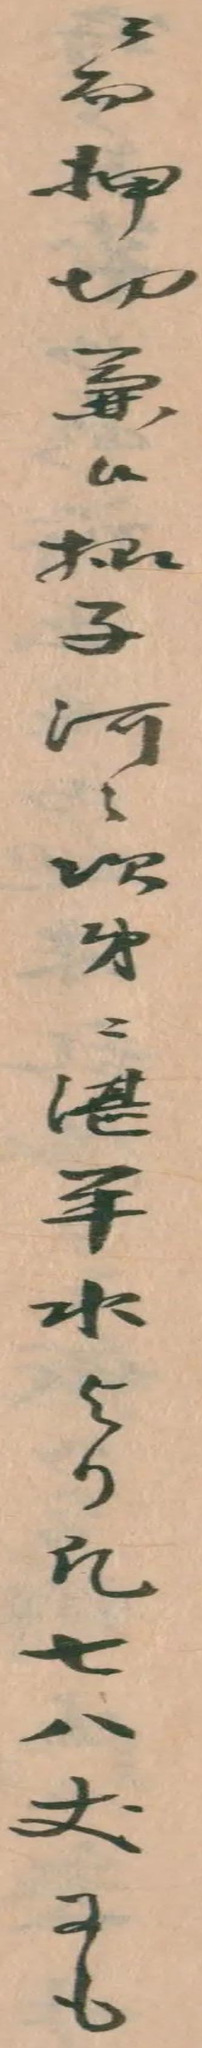ニ而押切兼候様子河之次第ニ湛平水より凡七八丈にも
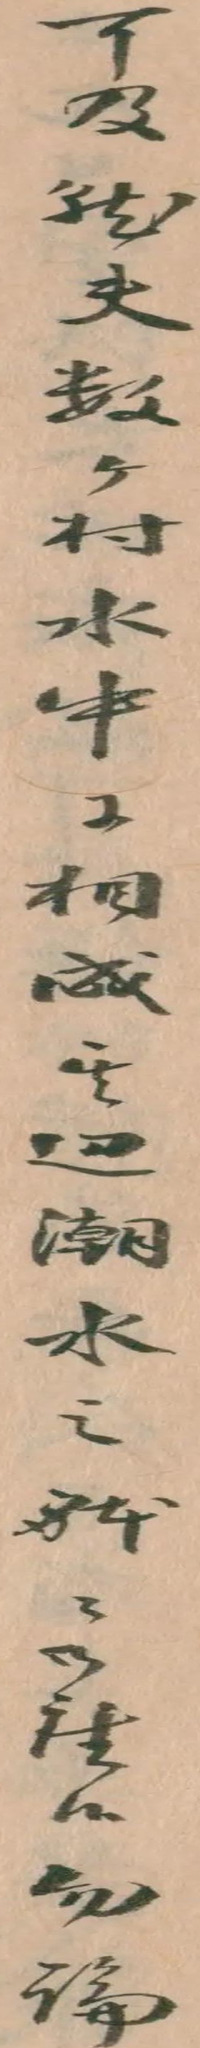可及就夫数ケ村水中に相成其辺潮水之躰ニ御座候勿論
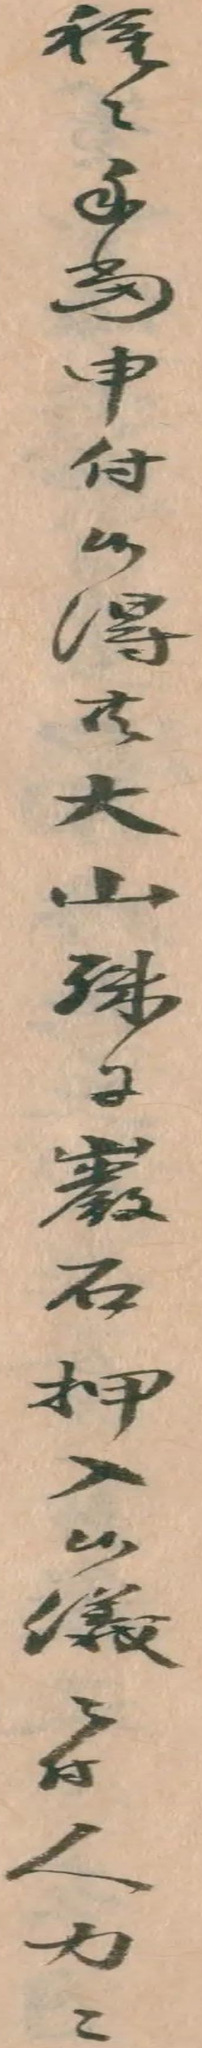種々手当申付候得共大山殊ニ巌石押入候儀ニ付人力ニ
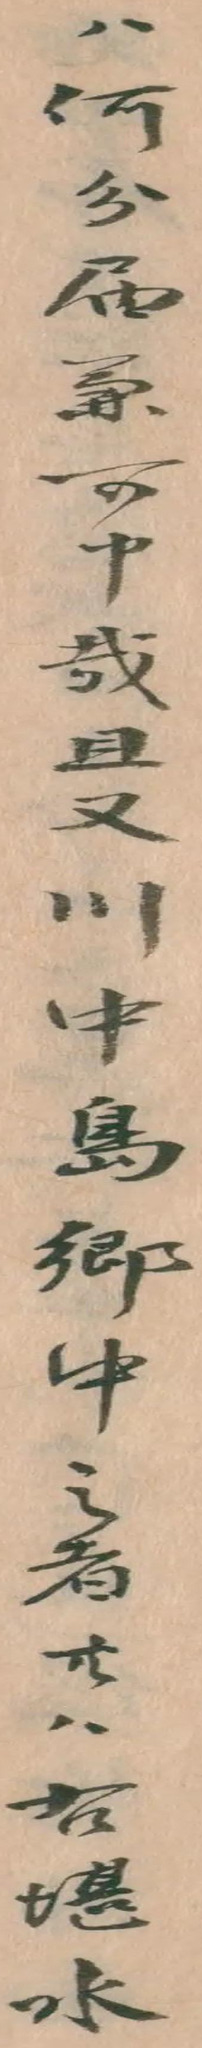ハ何分届兼可申哉且又川中島郷中之者共ハ右湛水
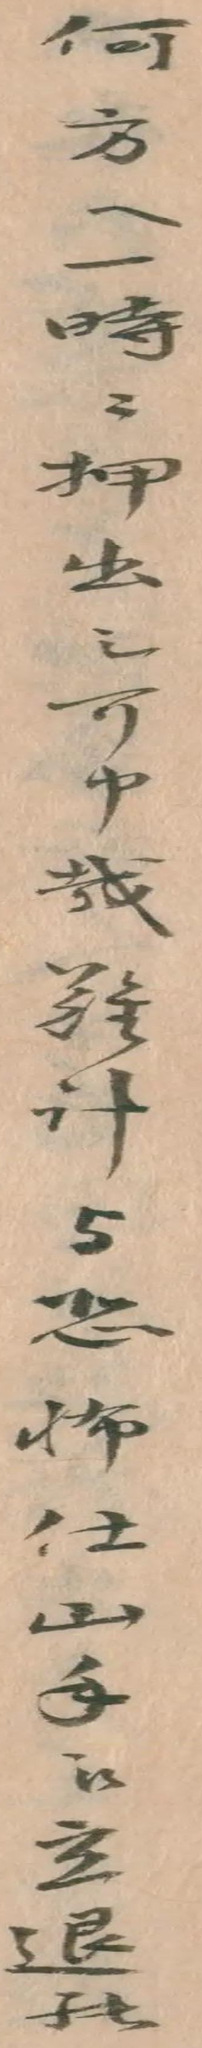何方へ一時二押出シ可申哉難計と恐怖仕山之手江立退罷
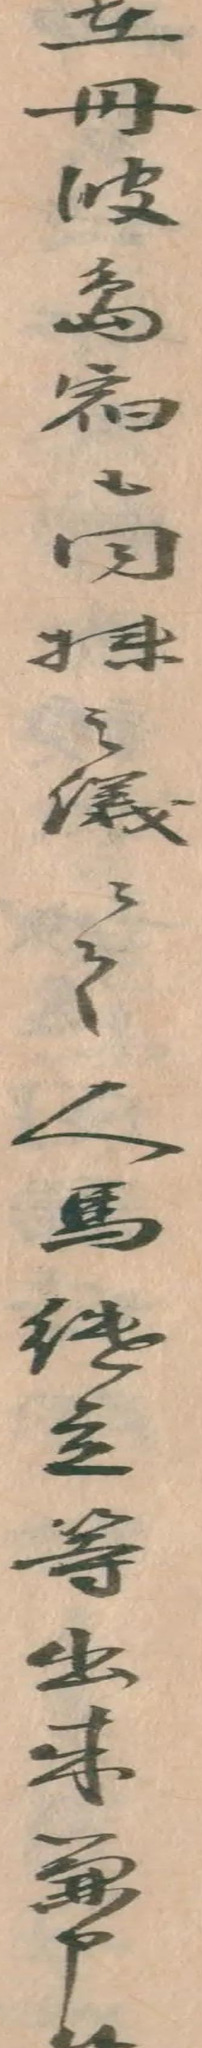在丹波島宿等も同様之儀にて人馬継立等出来兼申候
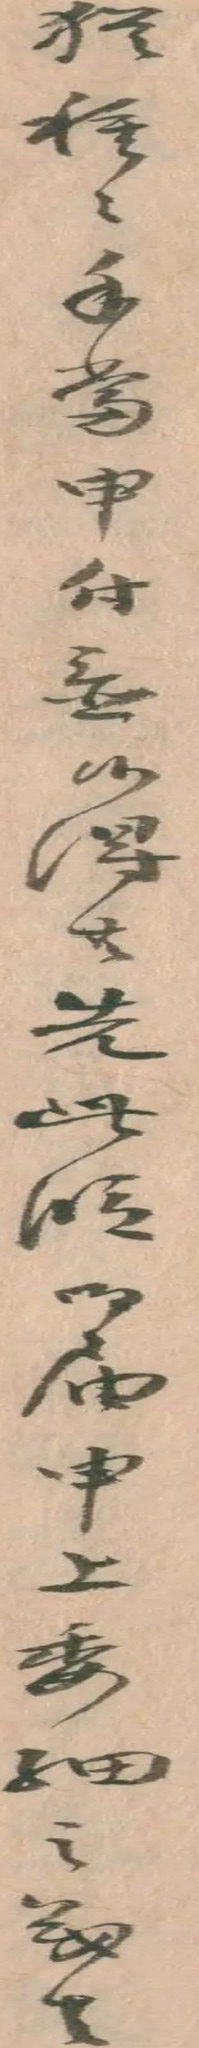猶種々手当申付置候得共先此段御届申上委細之儀者
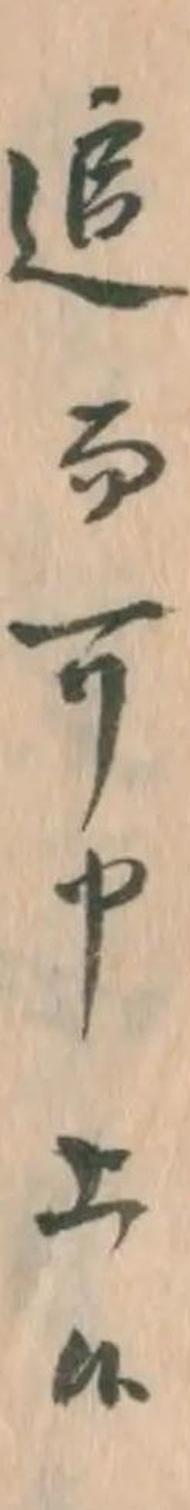追而可申上候

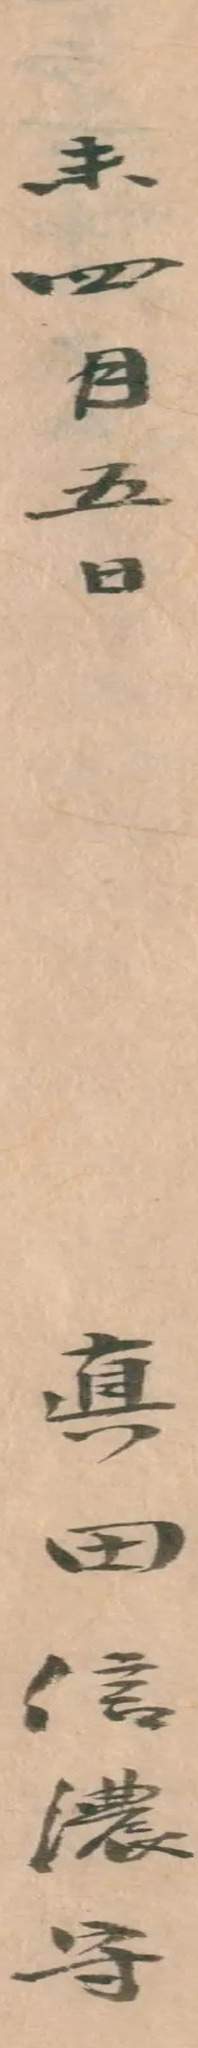未四月五日真田信濃守
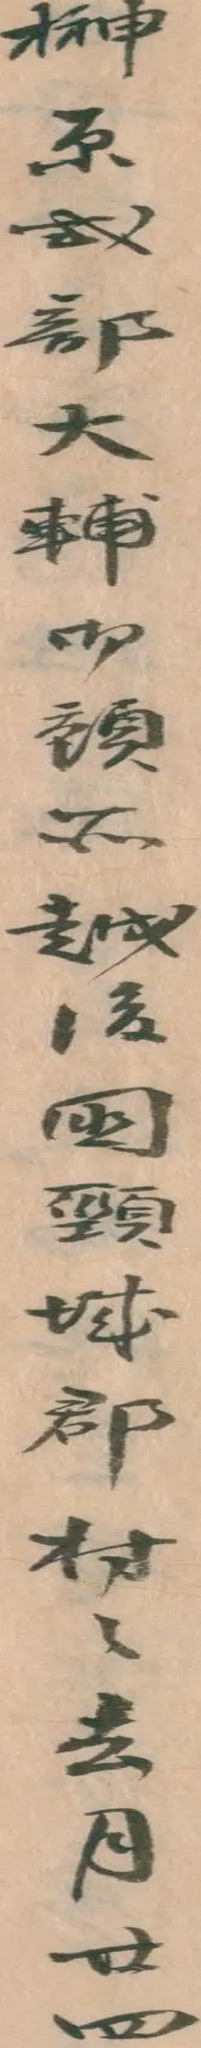榊原式部大輔御預所越後国頚城郡村々去月廿四
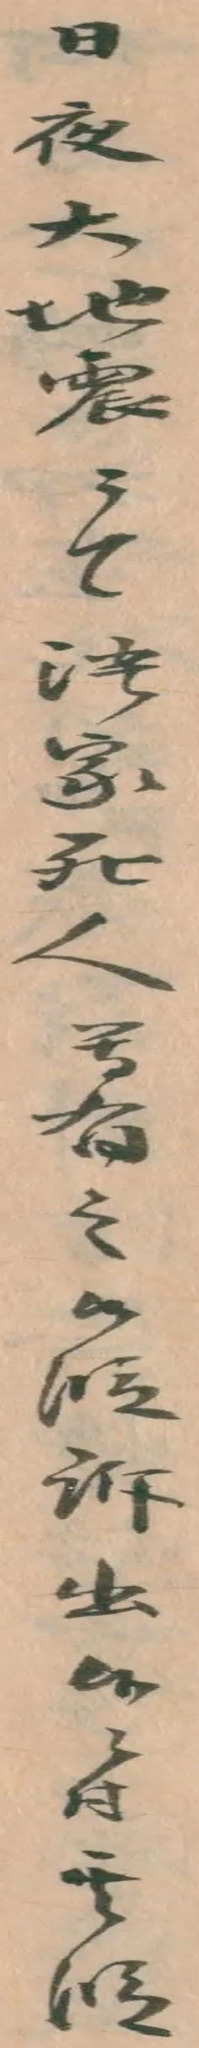日夜大地震にて潰家死人等有之候段訴出候付其段
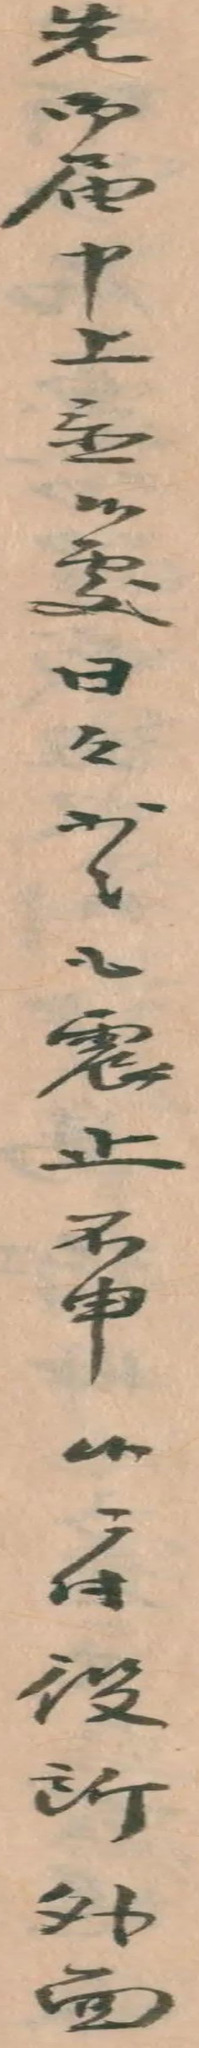先御届申上置候処日々少々も震止不申候二付役所外面
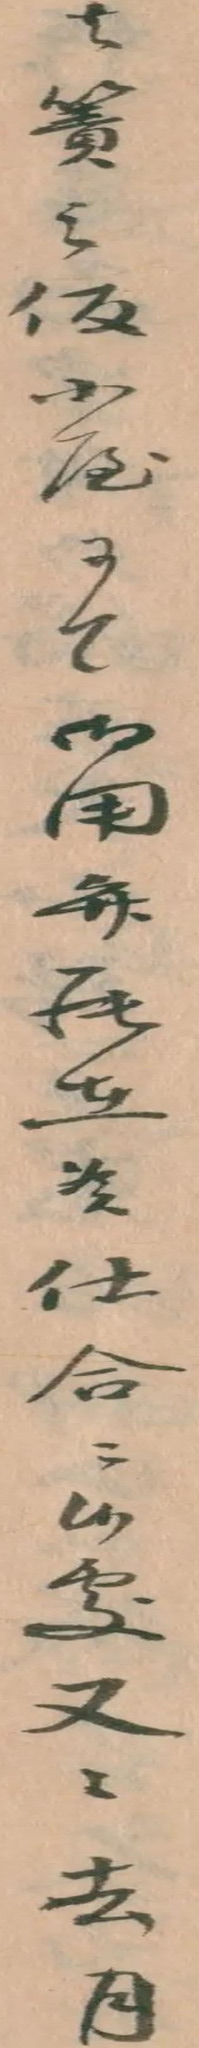者簀之仮小屋にて御用弁罷在候仕合二候処又々去月
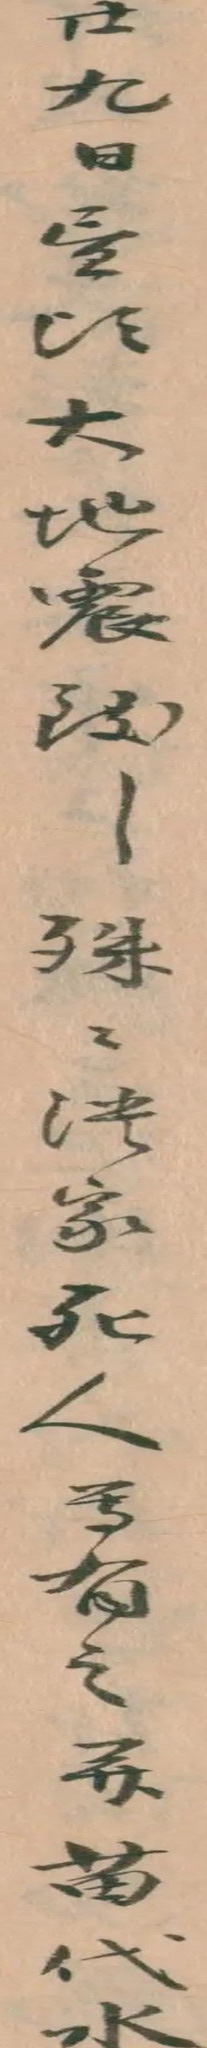廿九日昼頃大地震致し殊二潰家死人等有之并苗代水
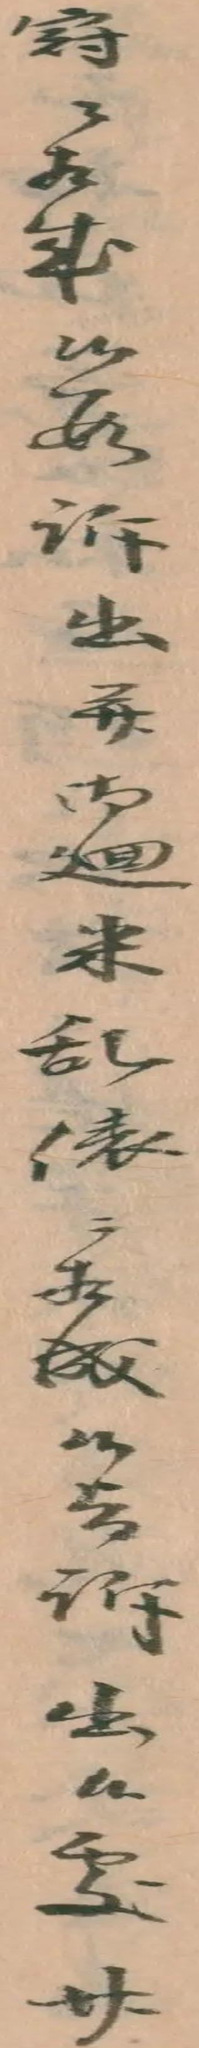冠ニ相成候段訴出并御廻米乱俵二相成候旨訴出候処廿
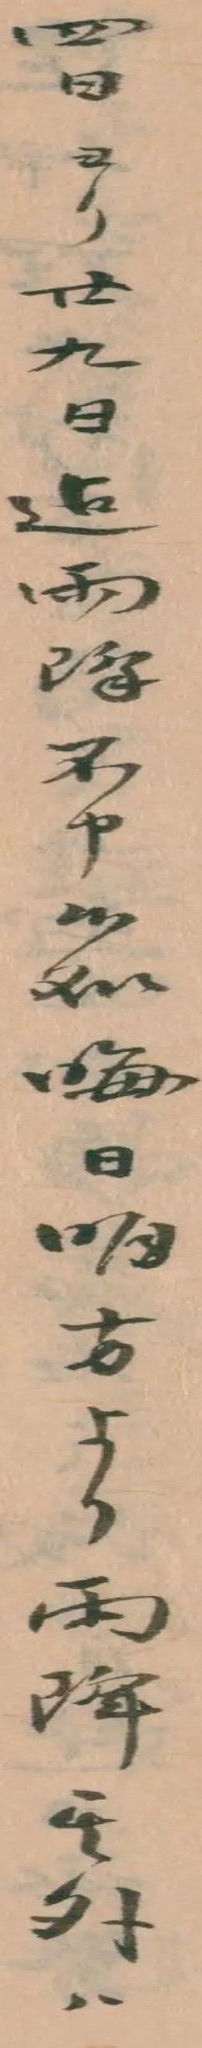四日ゟ廿九日迄雨降不申候処晦日明方ゟ雨降其外ハ
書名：地災撮要. 巻3(地震之部)-巻4(噴火之部)
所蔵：国立国会図書館 National Diet Library, JAPAN
